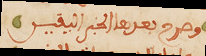وصرح بعدها الخبر اليقين
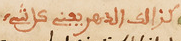كذلك الدهر يفنى كل شىء
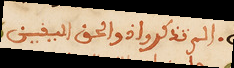الم تذكر واذ والحق اليقين
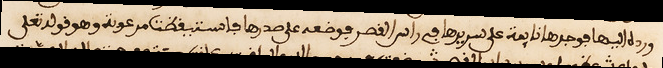ورده اليها فوجدها نائمة على سريرها في راس القصر فوضعه على صدرها فاستيقظت مرعوبة وهو قوله تعلى
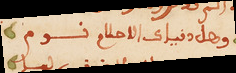وهل دنياك الاحلام نوم
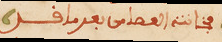فخانته العصا من بعد ما قد
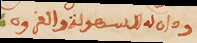ودان له السهولة والقرون
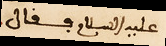عليه السلام فقال
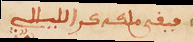فبقى ملكه كدا الليللى
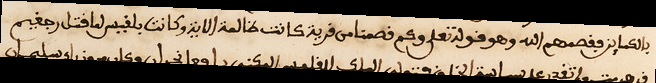بالكمائن فقصمهم الله وهو قوله تعلى وكم قصمنا من قرية كانت ظالمة الاية وكانت بلقيس لما قتل رجغيم
